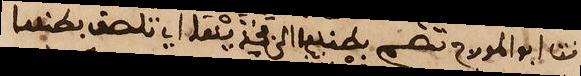نت ابو المورج تضم بطنها الى فخذيها اي تلصق بطنها
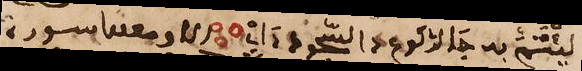ليئتم به جالركوع د السجود دايي الا ومعها سورة
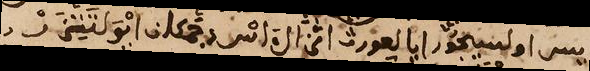يس اولسيجور ايا العورث اثزال ءاس دجمكان ايولتتزر
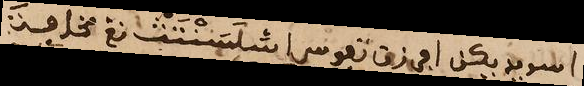اسويديكن افرزت تفوس اسلسنتث نغ مخافة
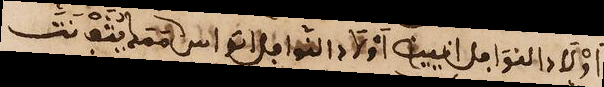اولا د النوافل انييض اولا د النوافل انواس ممك يثف نت
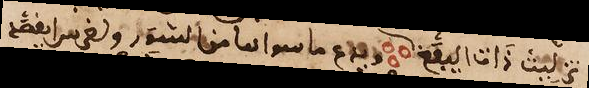تزليث ذات اليفغ ويدع ما سواها من السور ولغرس ايقصد
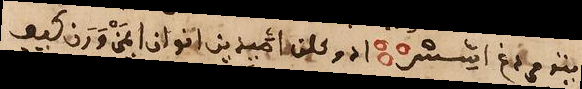يتومر دغ اسس ادوكلن اميدن انوان ايمورن كيف
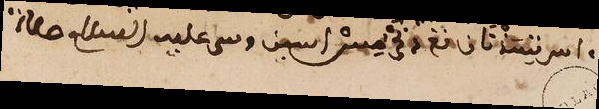ءاس تسذتان نغ دتحر مس اسين وسر عليه السلام صلاة
